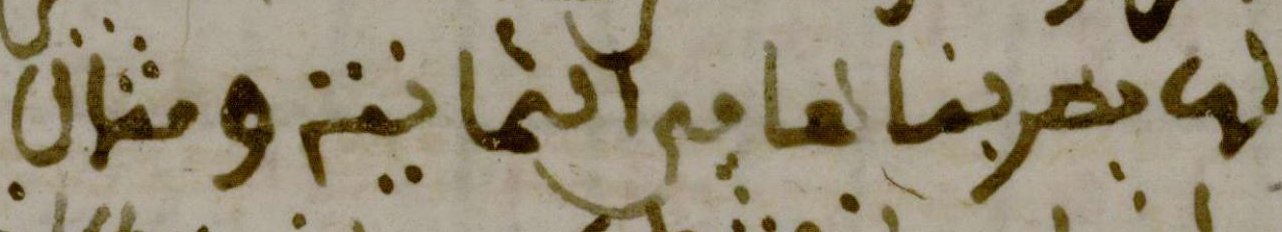لها يضربنا ها في الثمانية ومثال
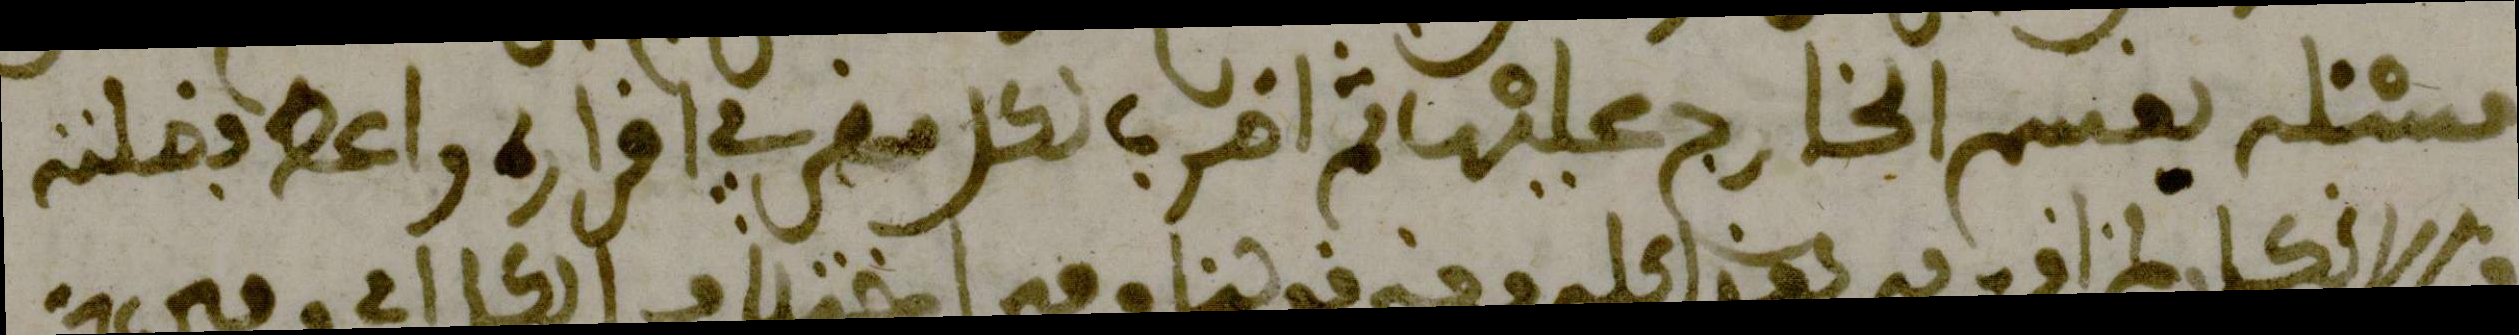مسْئله بقسم الخارج عليْها ثم اضرب لكل مقر في اقراره واعط فضلته
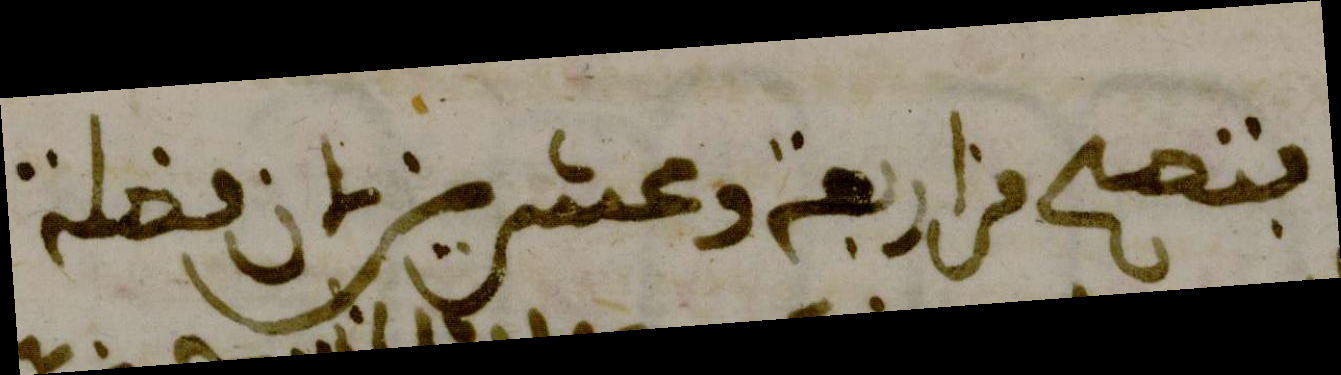فتصح من اربعة وعشرين لان فضلة
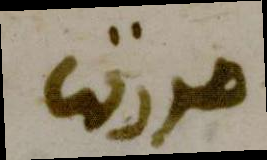صورتها
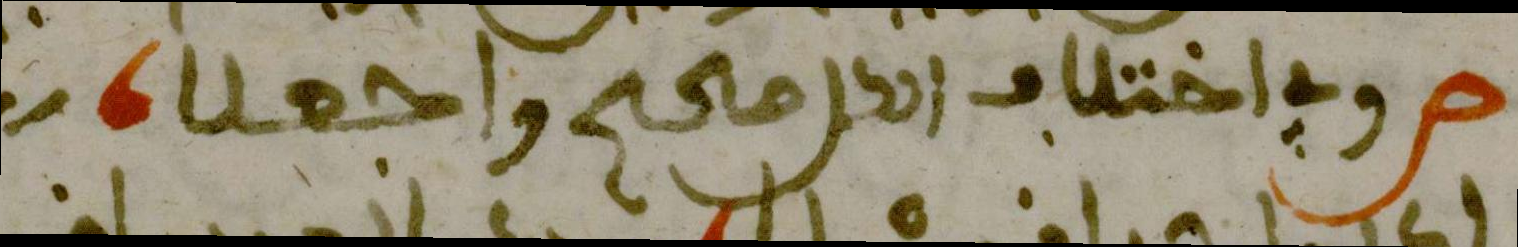ص وفي اختلاف الكل صحح واجعلا
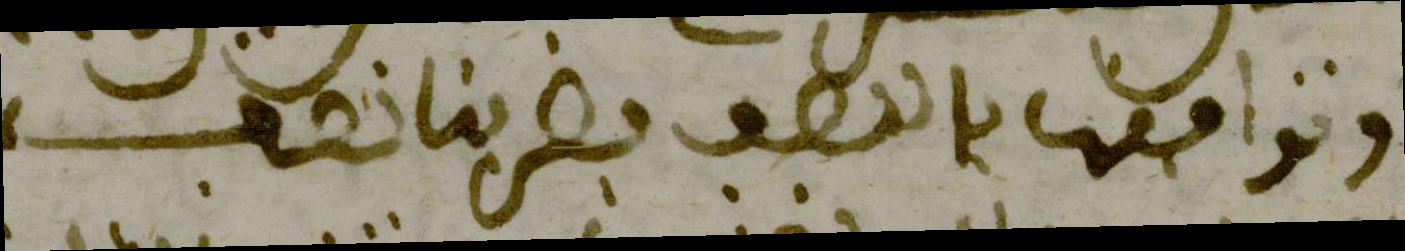وتوافقها بالنصف فضربنا نصف
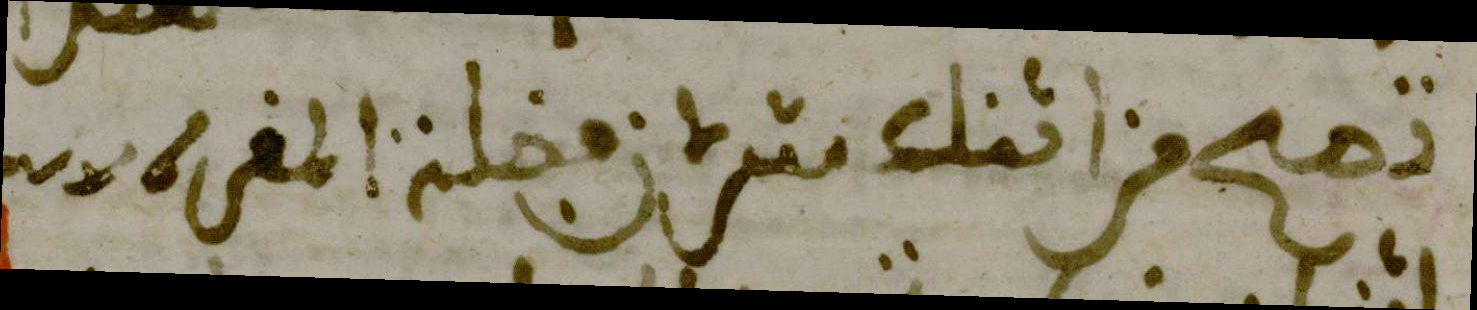تصح من اثنا عشر لان فضلة المقرة
